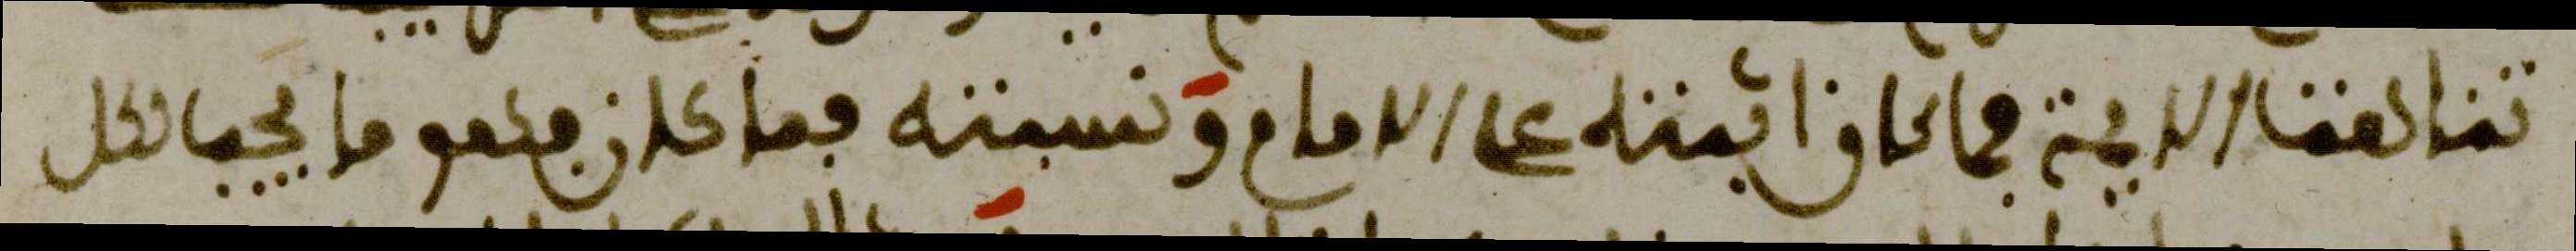تناهت الايمة فما كان اثبته على الامام ونسبته فما كان فهو ما يجب لكل
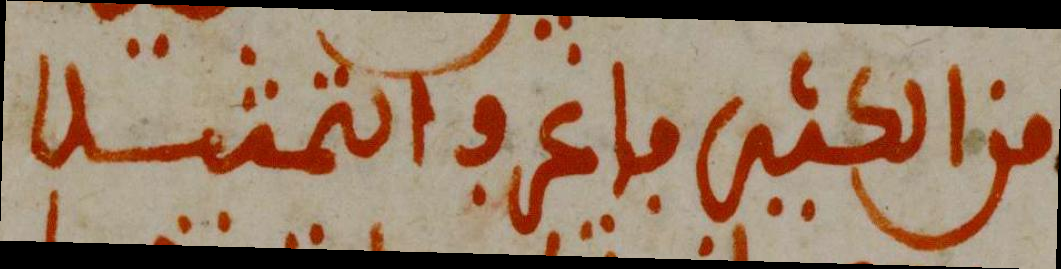من الكثير فاعرف التمثيلا
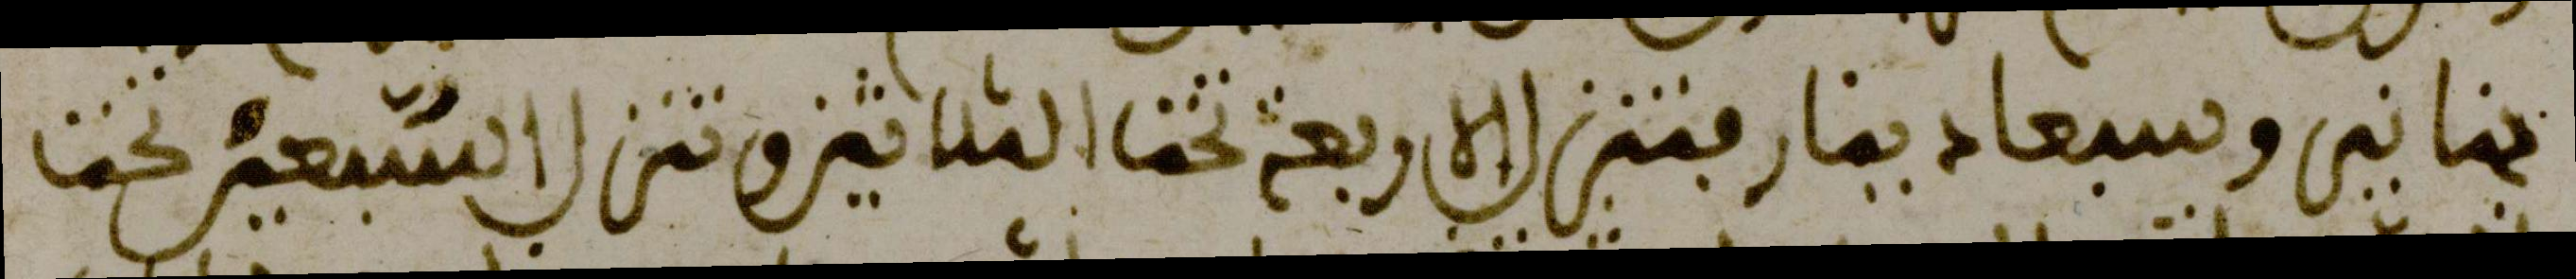دنانير وسبعا دينار فتنزل الاربعة تحت الثلاثين وتنزل السّبعين تحت
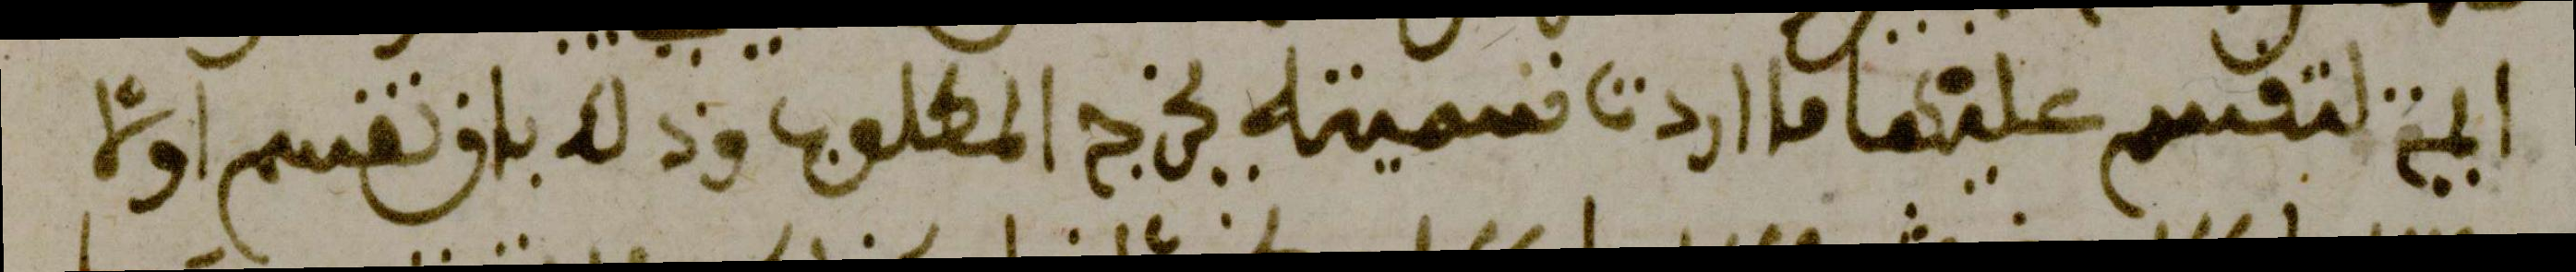ايمة لتقسم عليْها ما اردت تسمية يخرج المطلوب وذلك بان تقسم اولا
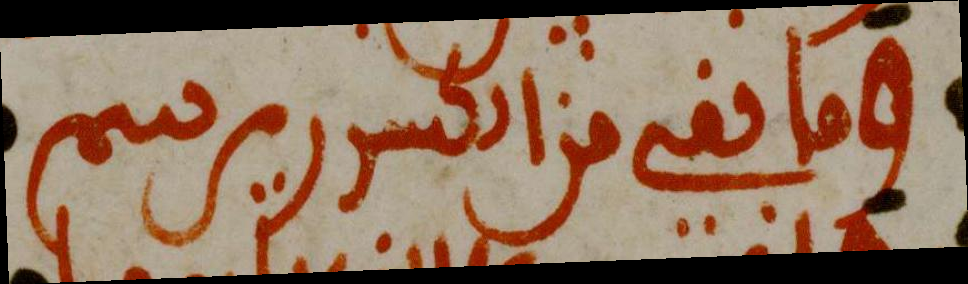وما بقي من الكسور يرسم
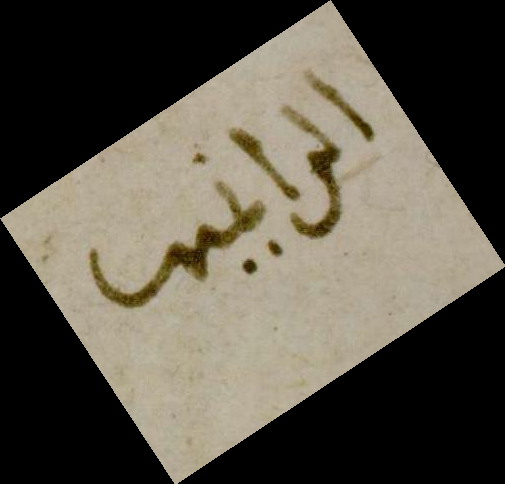الى انميها
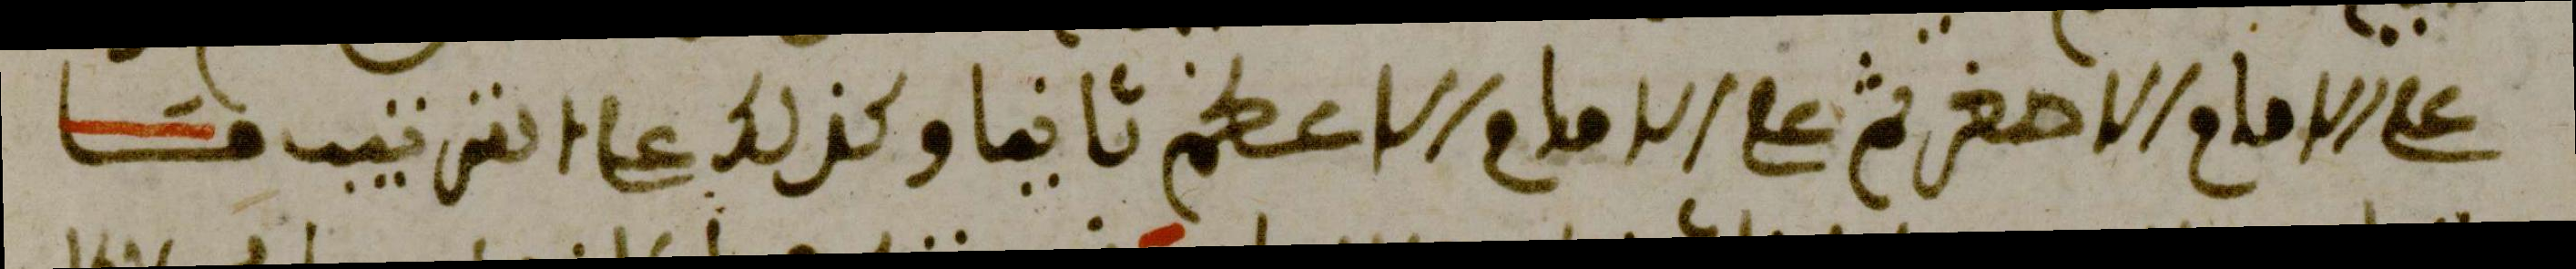على الامام الاصغر ثم على الامام الاعظم ثانيا وكذلك على الترتيب ما
